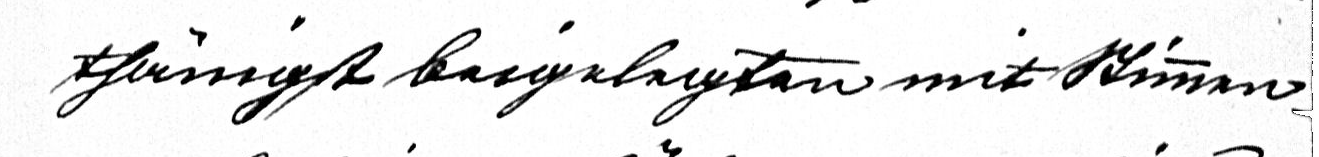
thänigst beigelegten mit Stimmen
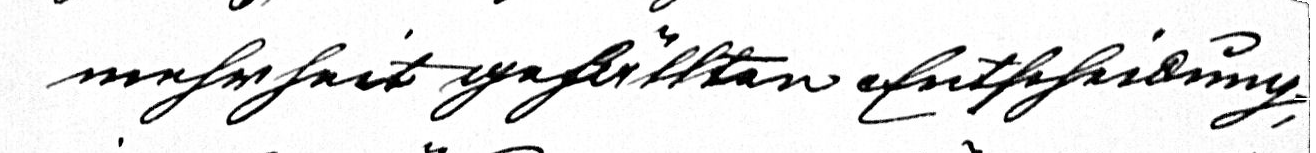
Mehrheit gefällten Entscheidung,
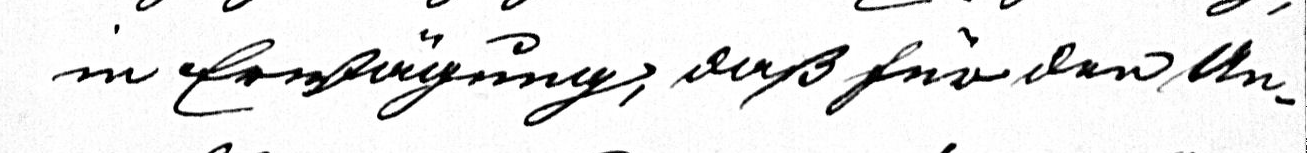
in Erwägung, daß für den An¬
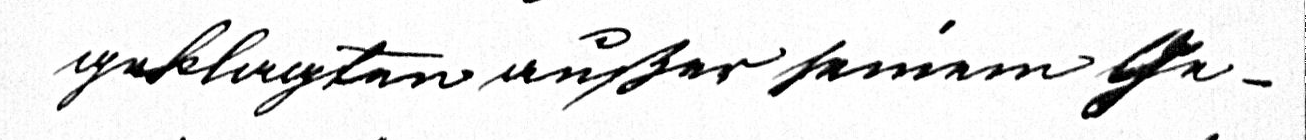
geklagten außer seinem Ge¬
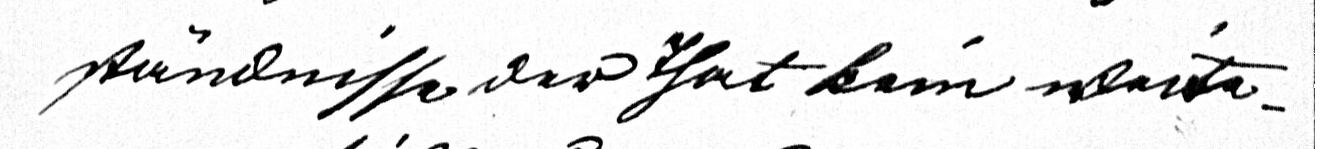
ständnisse der That kein weite¬
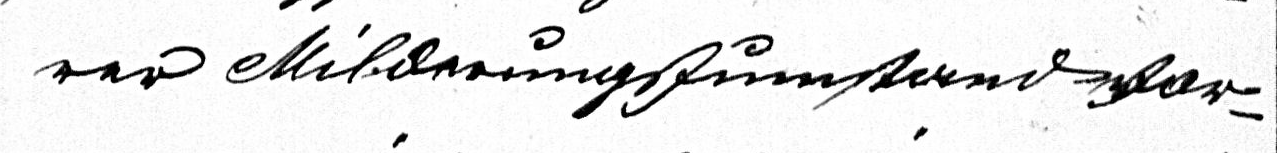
rer Milderungsumstand vor¬
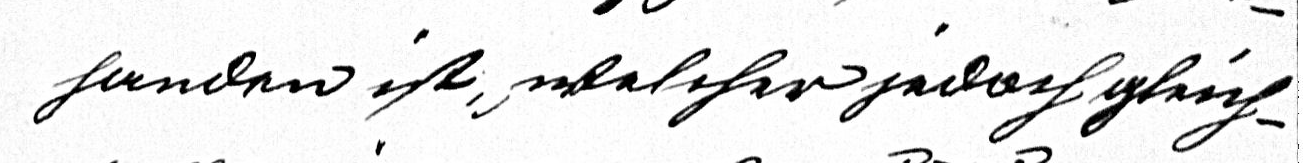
handen ist, welcher jedoch gleich¬
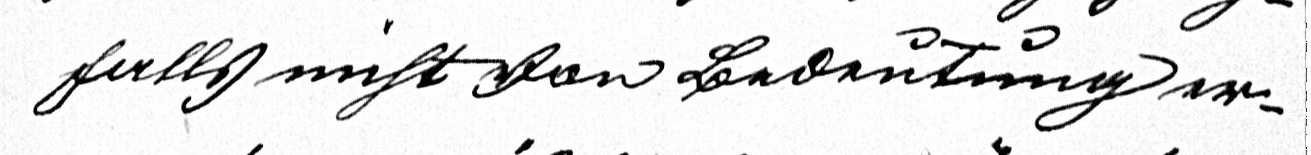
falls nicht von Bedeutung er¬
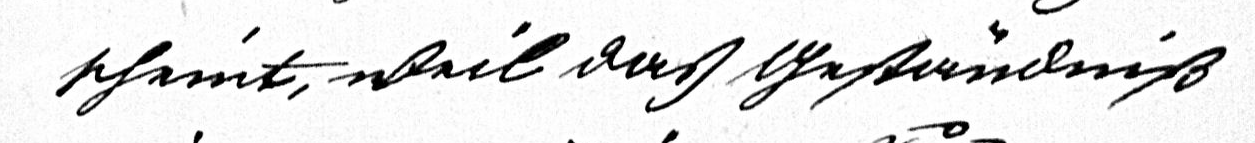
scheint, weil das Geständniß¬
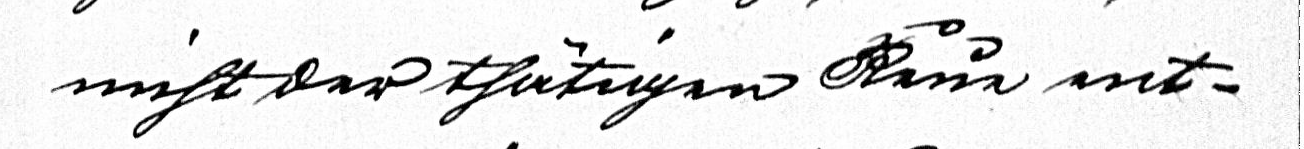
nicht der thätigenReue ent¬
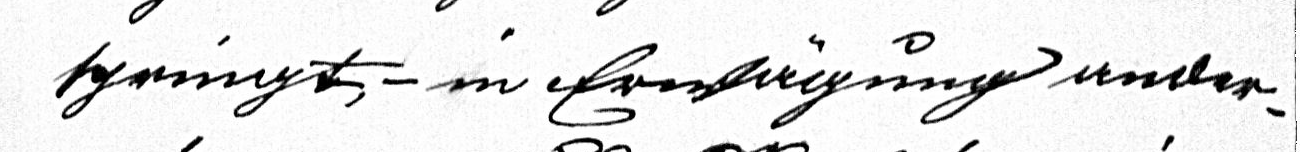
springt, - in Erwägung ander¬
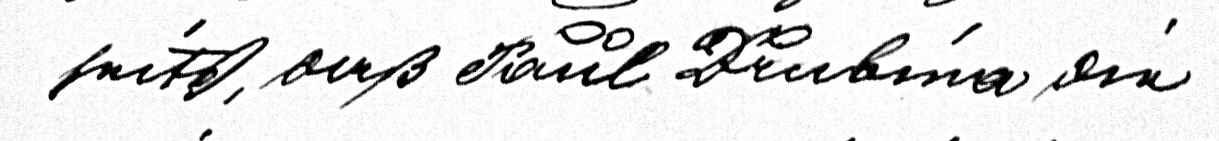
seits, daß Paul Drubina die
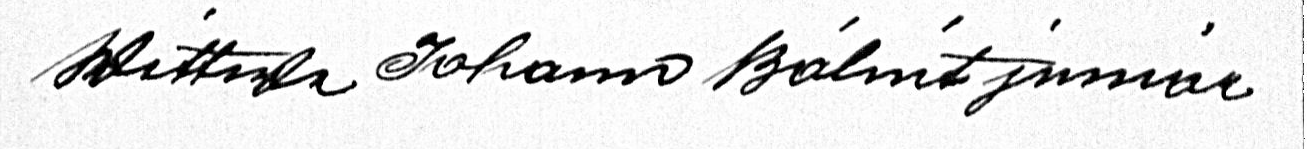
Wittwe Johann Bálint junior
